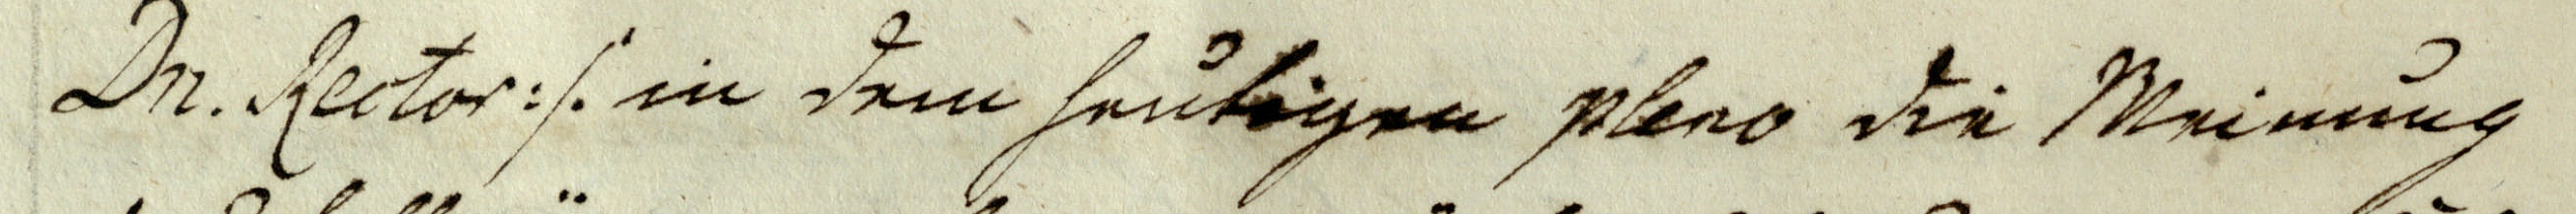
Dn Rector :/. in dem heutigen pleno die Meinung
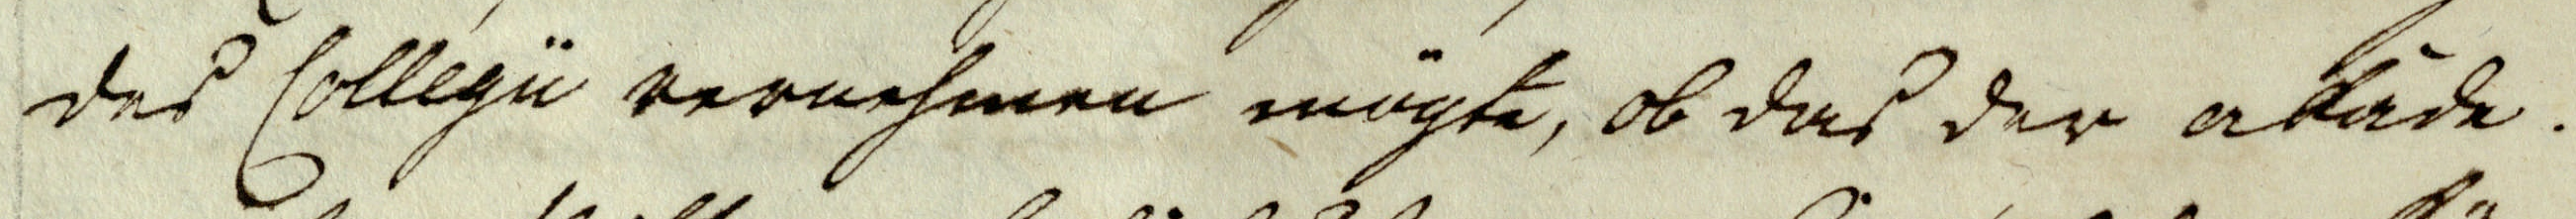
des Collegii vernehmen möchte, ob das der akade¬
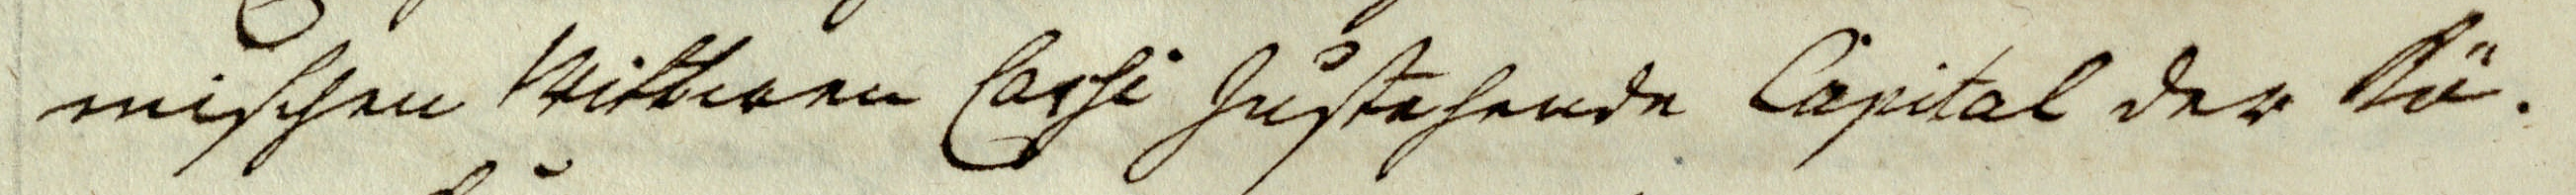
mischen Wittwen Casse zustehende Capital der Kö¬
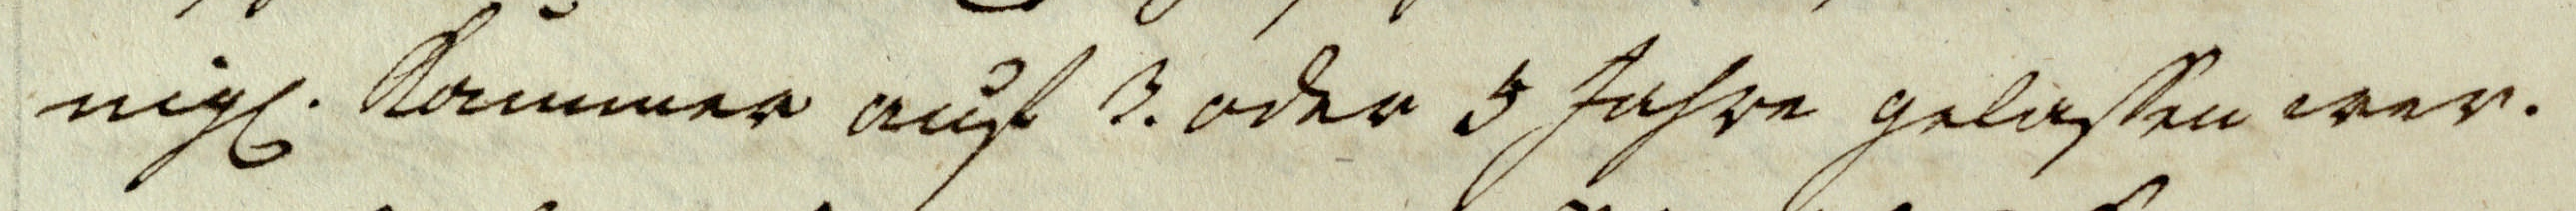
nigl. Kammer auf 3. oder 5 Jahre gelassen wer¬
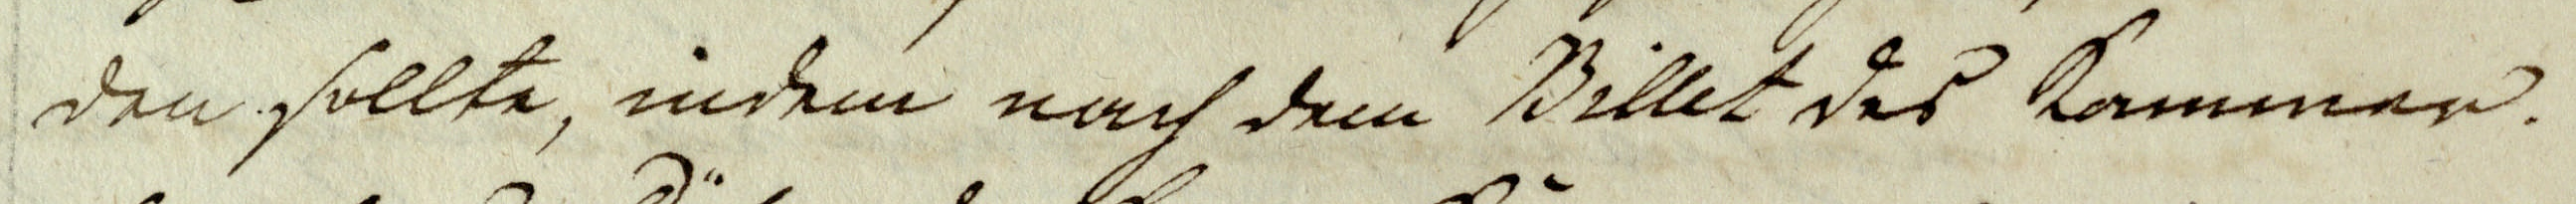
den sollte, indem nach dem Billet des Kammer¬
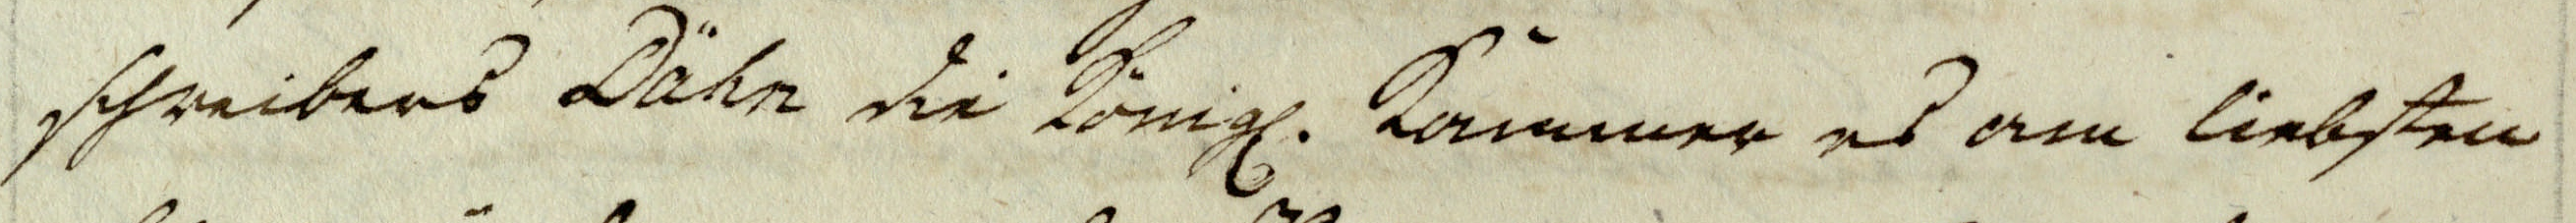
schreibers Dähn die Königl. Kammer es am liebsten
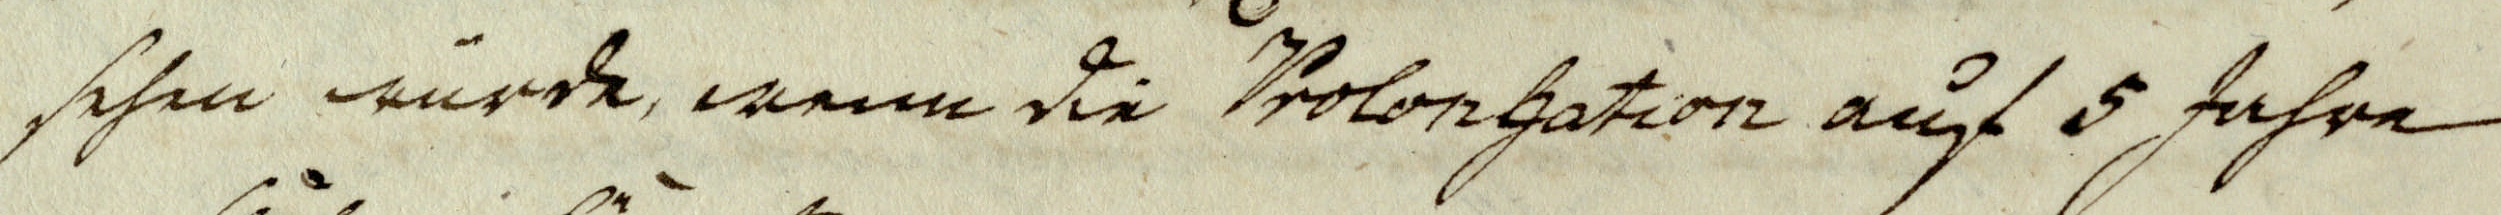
sehen würde, wenn die Prolongation auf 5 Jahre
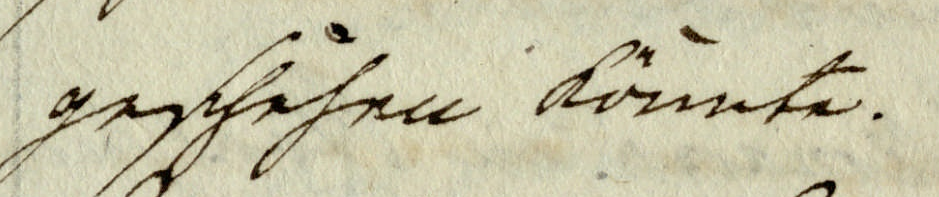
geschehen könnte.
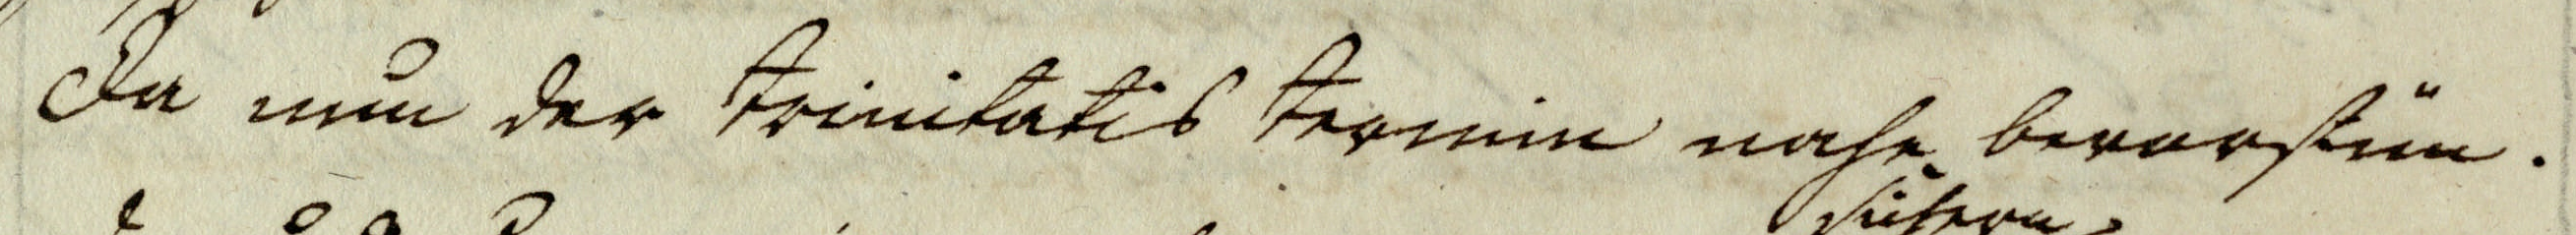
Da nun der Trinitatis Termin nahe bevorstün¬
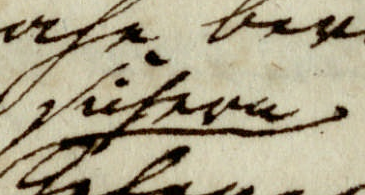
sichern
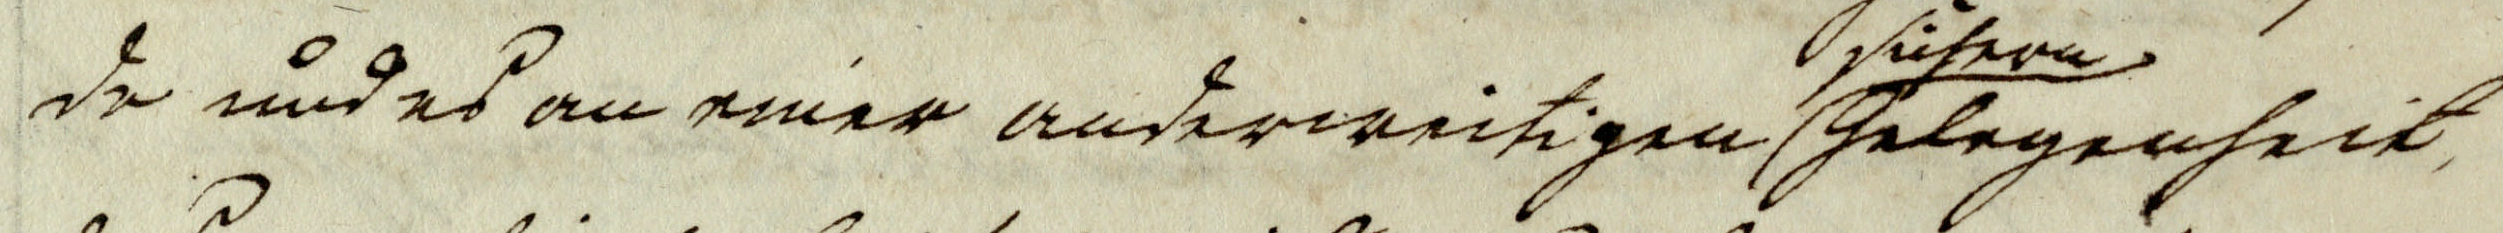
de und es an einer anderweitigen Gelegenheit,
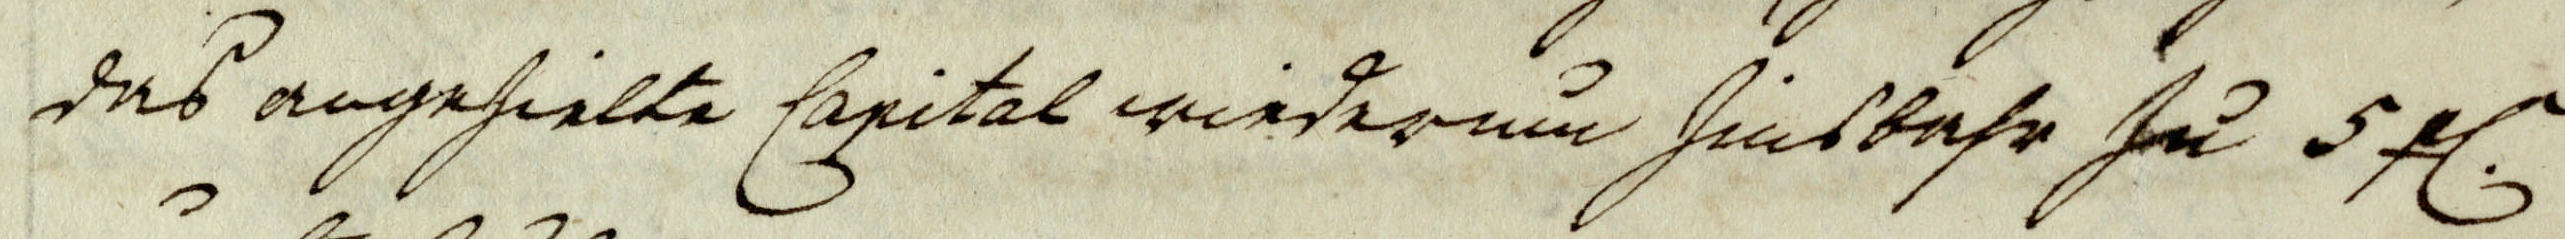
das angezielte Capital wiederum zinsbahr zu 5 xxx
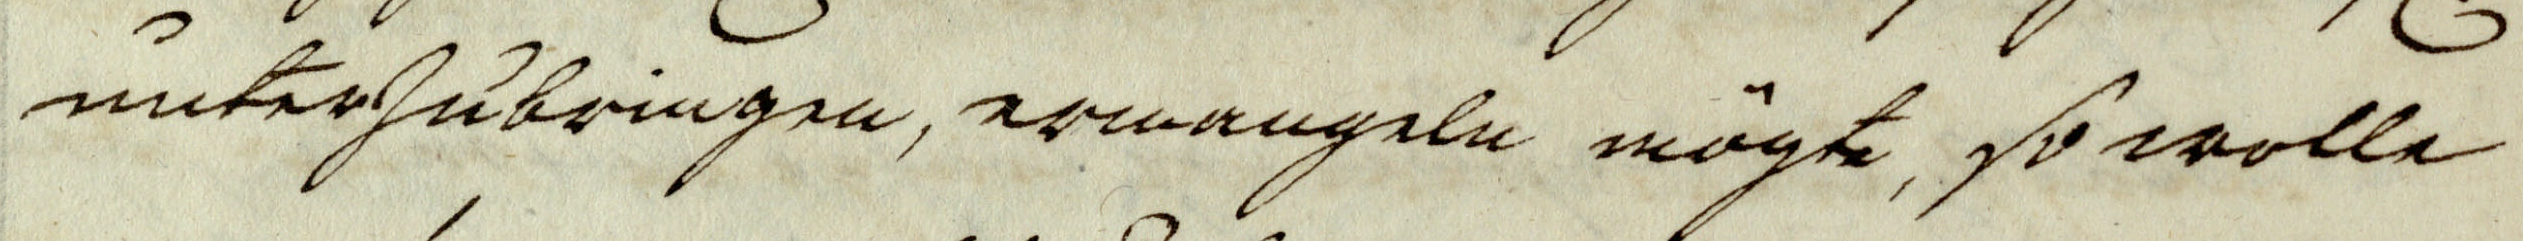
unterzubringen, ermangeln möchte, so wolle
